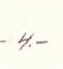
4
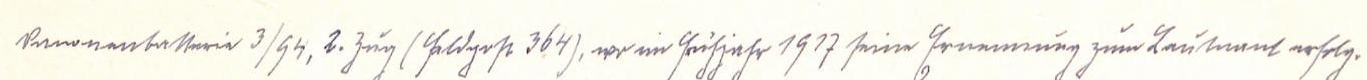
kanonen batterie 3/94, 2. Zug (Feldpost 364), wo in Frühjahr 1917 die Ernennung zum Leutnant erfolg-
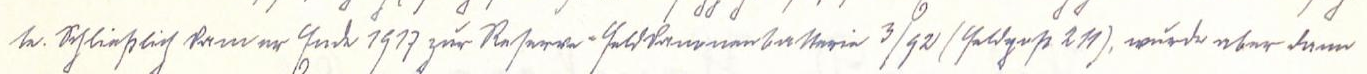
te. Schließlich kam er Ende 1917 zur Reserve – Feldkanonenbatterie 3/92 (Feldpost 211), wurde aber dann
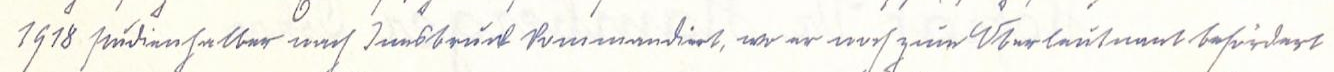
1918 studienhalber nach Innsbruck kommandiert, wo er noch zum Oberleutnant befördert
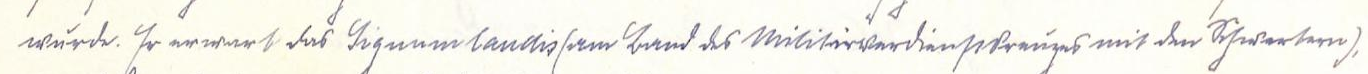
wurde. Er erwarb das Signum laudis (am Band des Militärverdienstkreuzes mit den Schwertern),
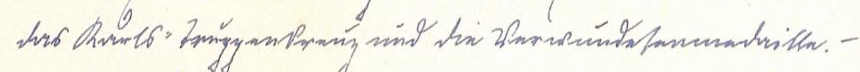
das Karls-Truppenkreuz und die Verwundetenmedaille.
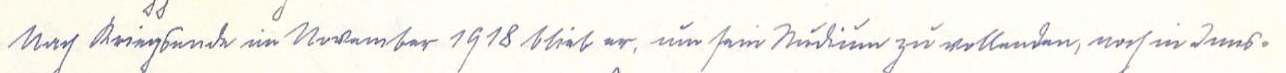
Nach Kriegsende im November 1918 blieb er, um sein Studium zu vollenden, noch in Inns-
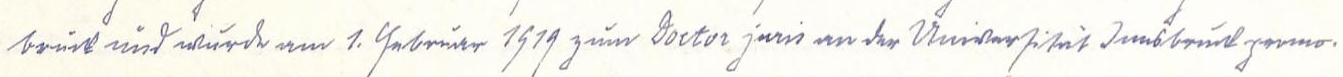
bruck und wurde am 1. Februar 1919 zum Doctor juris an der Universität Innsbruck promo-
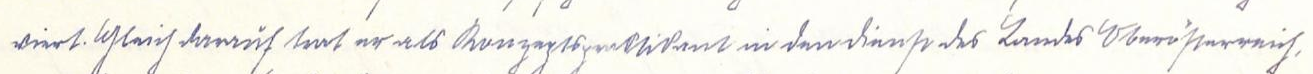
viert. Gleich darauf trat er als Konzeptspraktikant in den Dienst es Landes Oberösterreich,
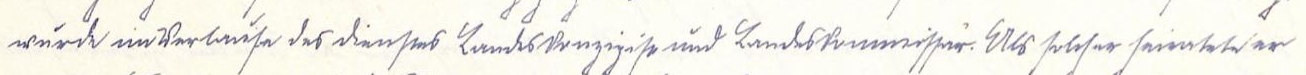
wurde im Verlaufe des Dienstes Landeskonzipist und Landeskommissar. Als solcher heiratete er
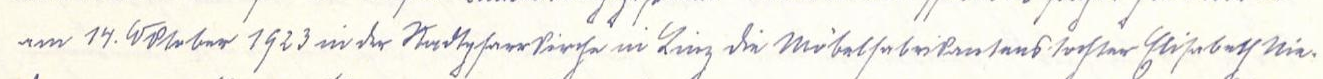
am 14. Oktober 1923 in der Stadtpfarrkirche in Linz die Möbelfabrikantenstochter Elisabeth Nie-
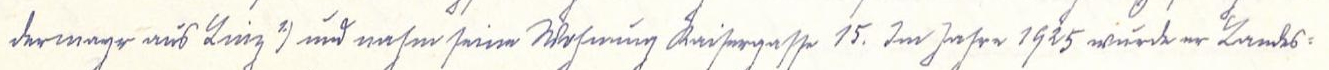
mayr aus Linz 1) und seine Wohnung Kaisergasse 15. Im Jahre 1925 wurde er Landes-
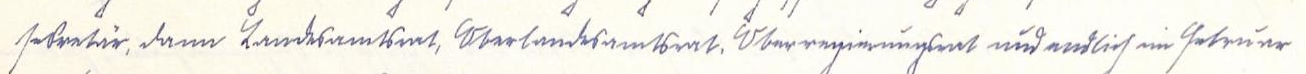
sekretär, dann Landesamtsrat, Oberlandesamtsrat, Oberregierungsrat und endlich im Februar
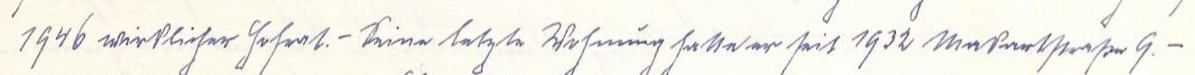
1946 wirklicher Hofrat. - Seine letzte Wohnung hatte er seit 1932 Markartstraße 9.-
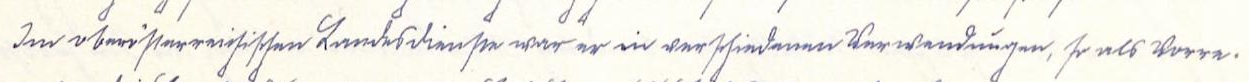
Im oberösterreichischen Landesdienste war er im verschiedenen Verwendungen, so als Vorre-
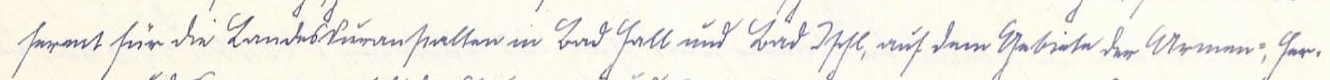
ferent für die Landeskuranstalten in Bad Hall und Bad Ischl, auf dem Gebiete der Armen -, Her-
